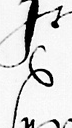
1.)
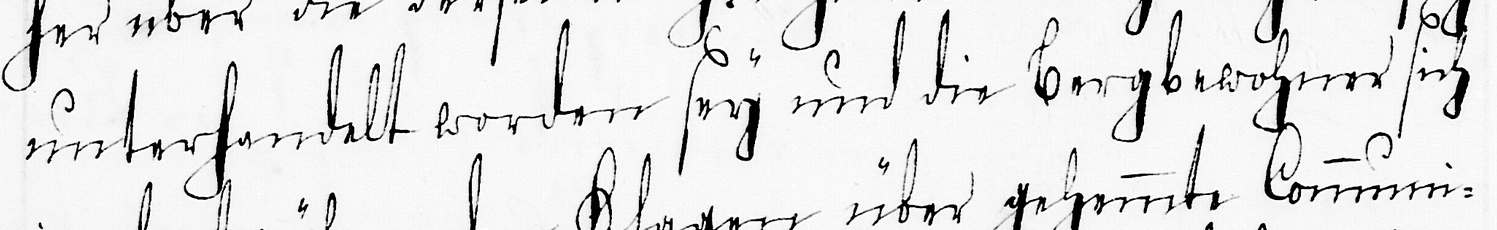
unterhandelt worden sey und die Bergbewohner sich
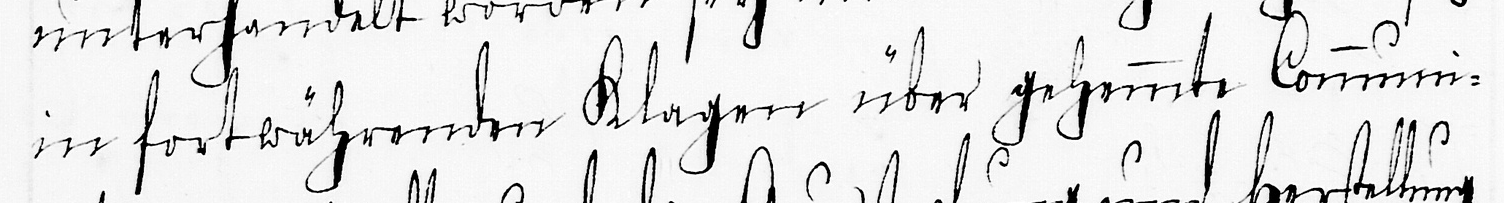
in fortwährenden Klagen über gehemmte Communi¬
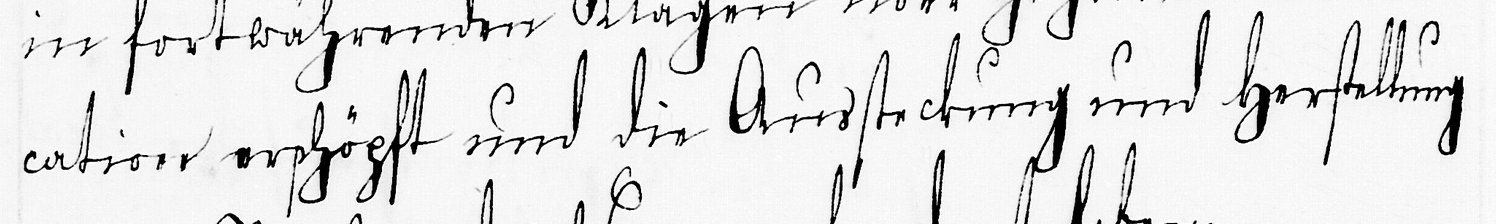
cation erschöpft und die Aussteckung und Herstellu¬
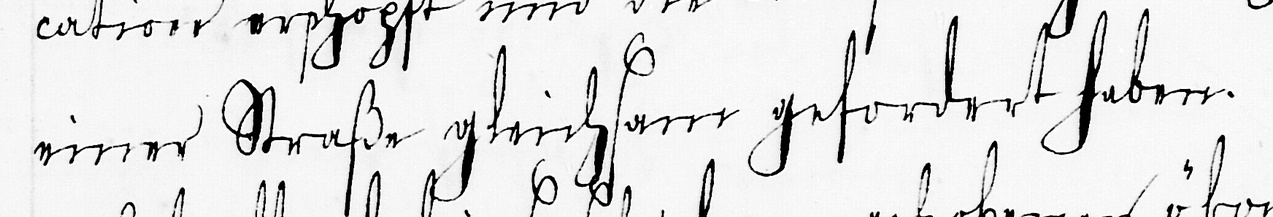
einer Straße gleichsam gefordert haben.
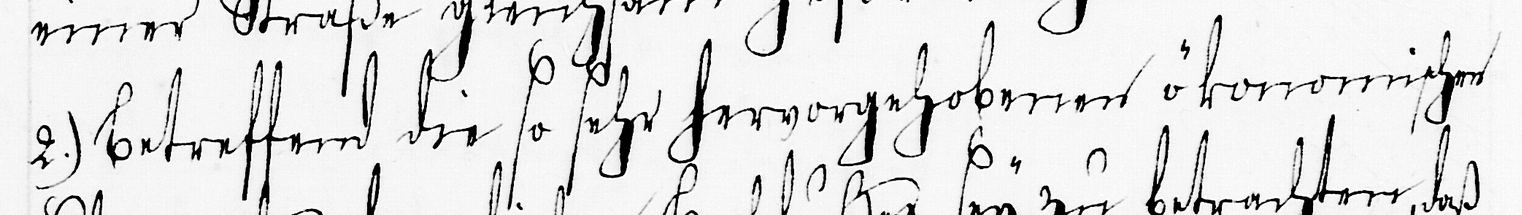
2.) Betreffend die so sehr hervorgehobenen ökonomischen
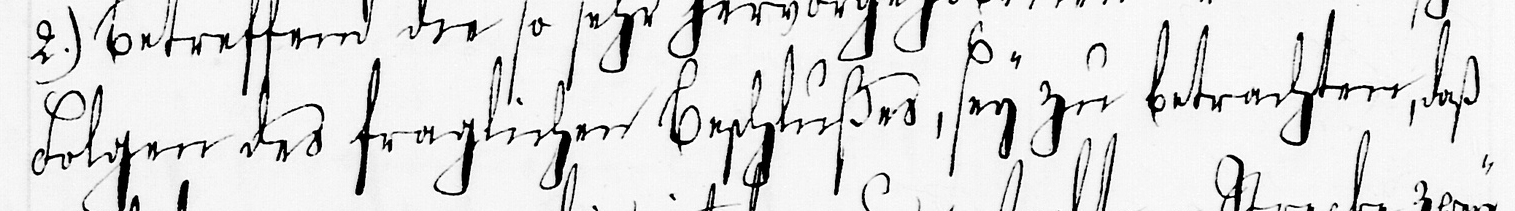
Folgen des fraglichen Beschlußes, sey zu betrachten, daß
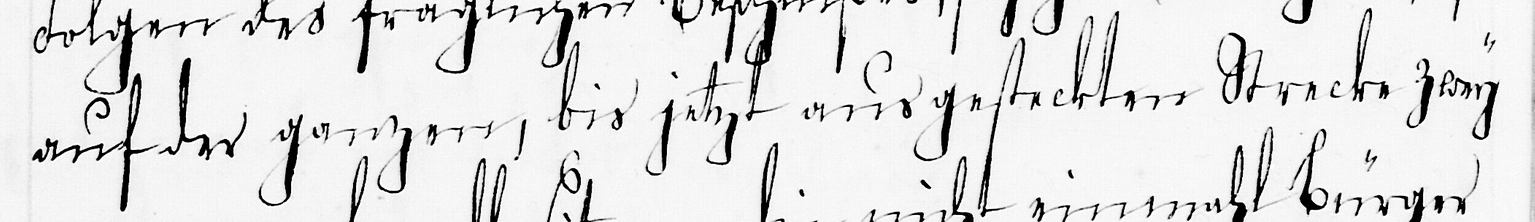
auf der ganzen, bis jetzt ausgesteckten Strecke zwey
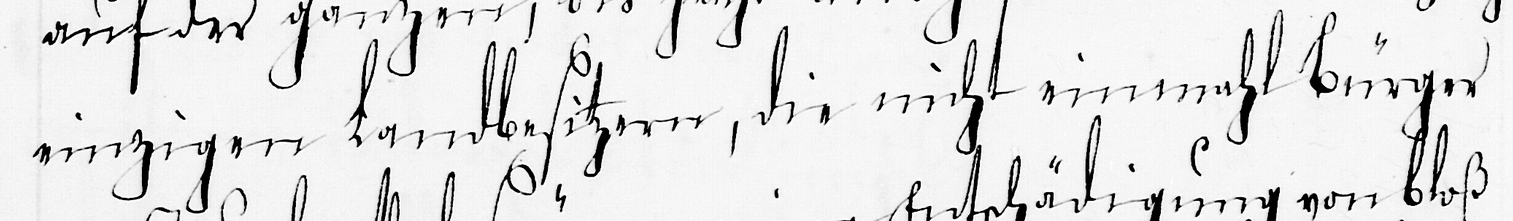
einzigen Landbesitzern, die nicht einmahl Bürger
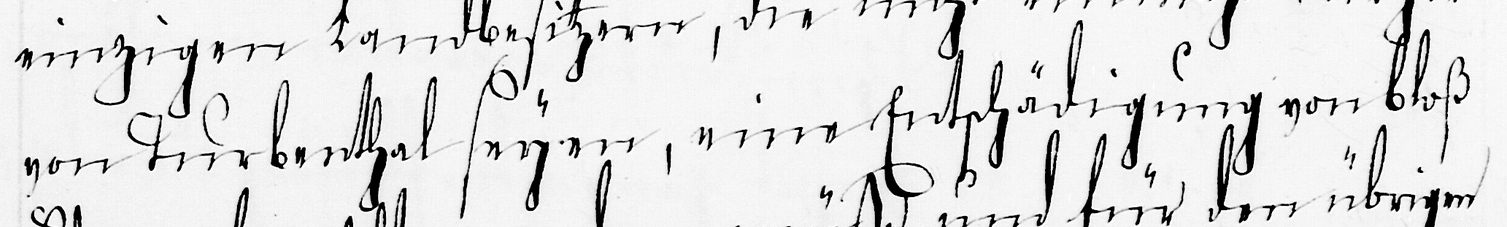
von Turbenthal seyen, eine Entschädigung von bloß
